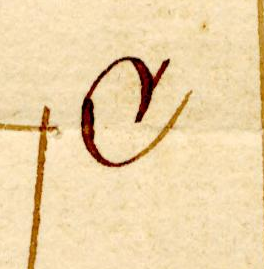C
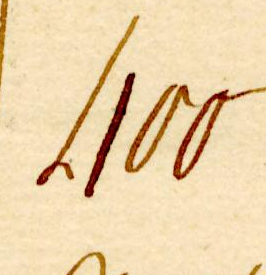400
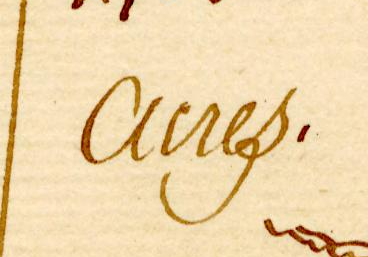Acres.
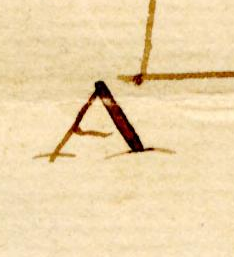A
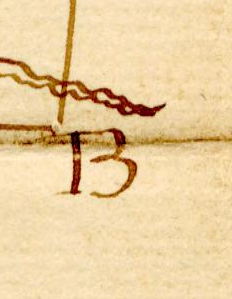B
